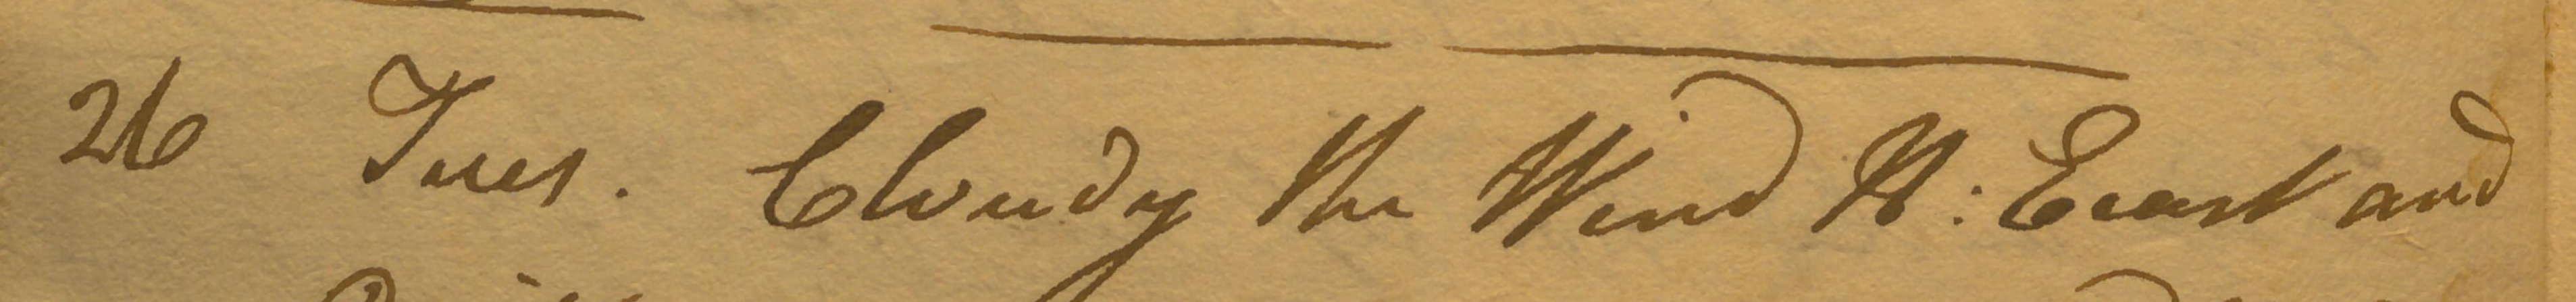26 Tues. Cloudy the Wind N: East and
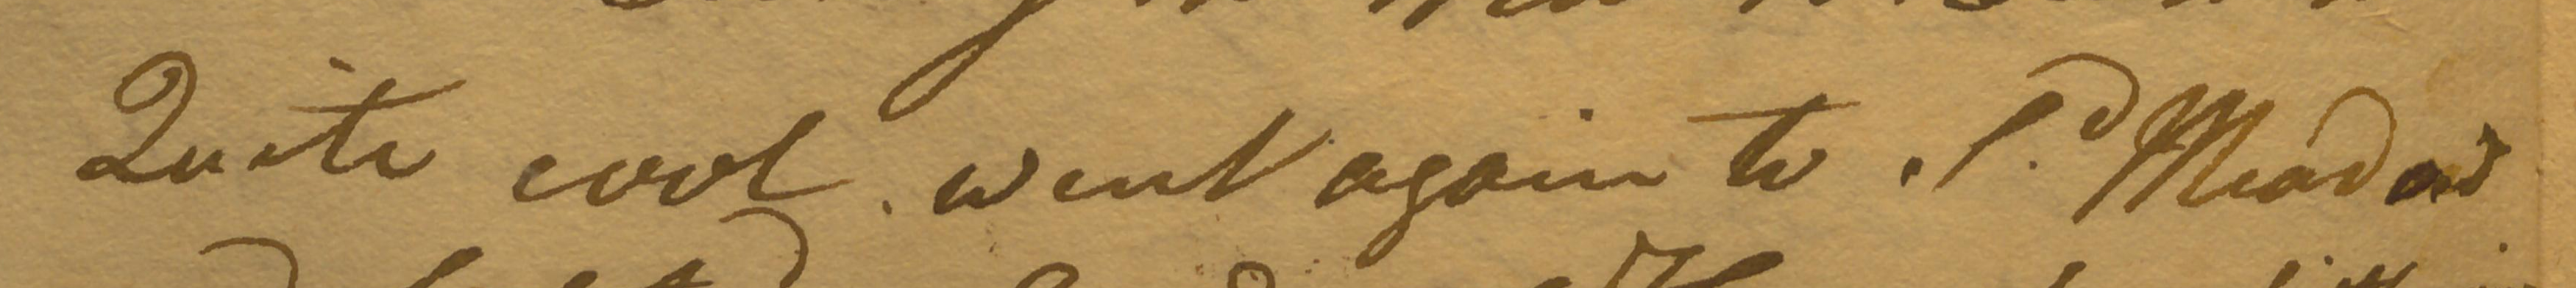Quite cool. went again to S^d. Meadow
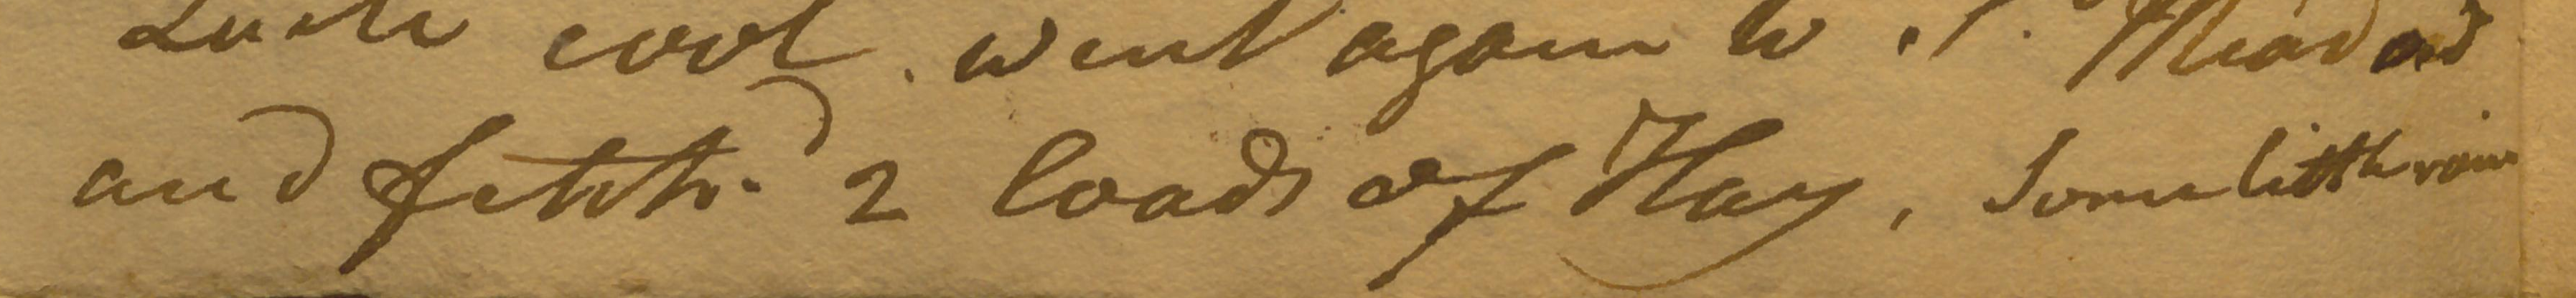and fetch^d. 2 loads of Hay, Some little rain
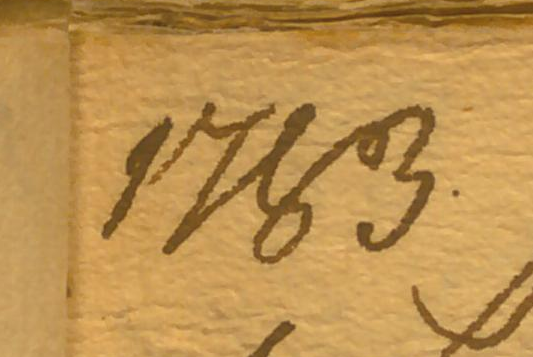1783
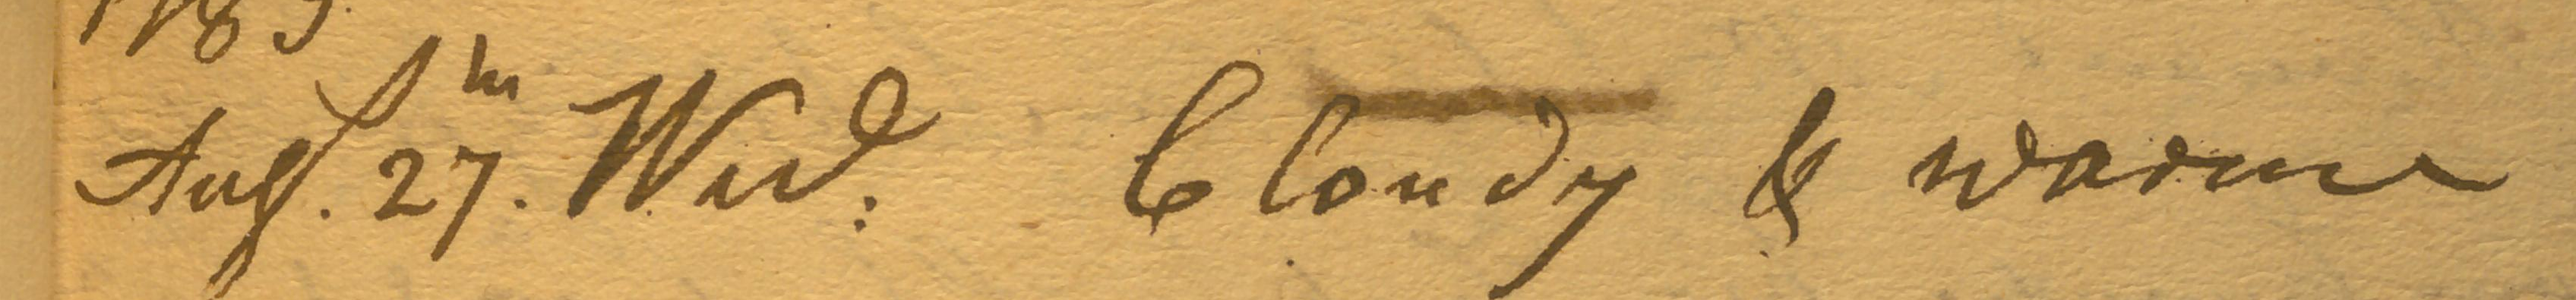Aug^t. 27^th. Wed: Cloudy & warme
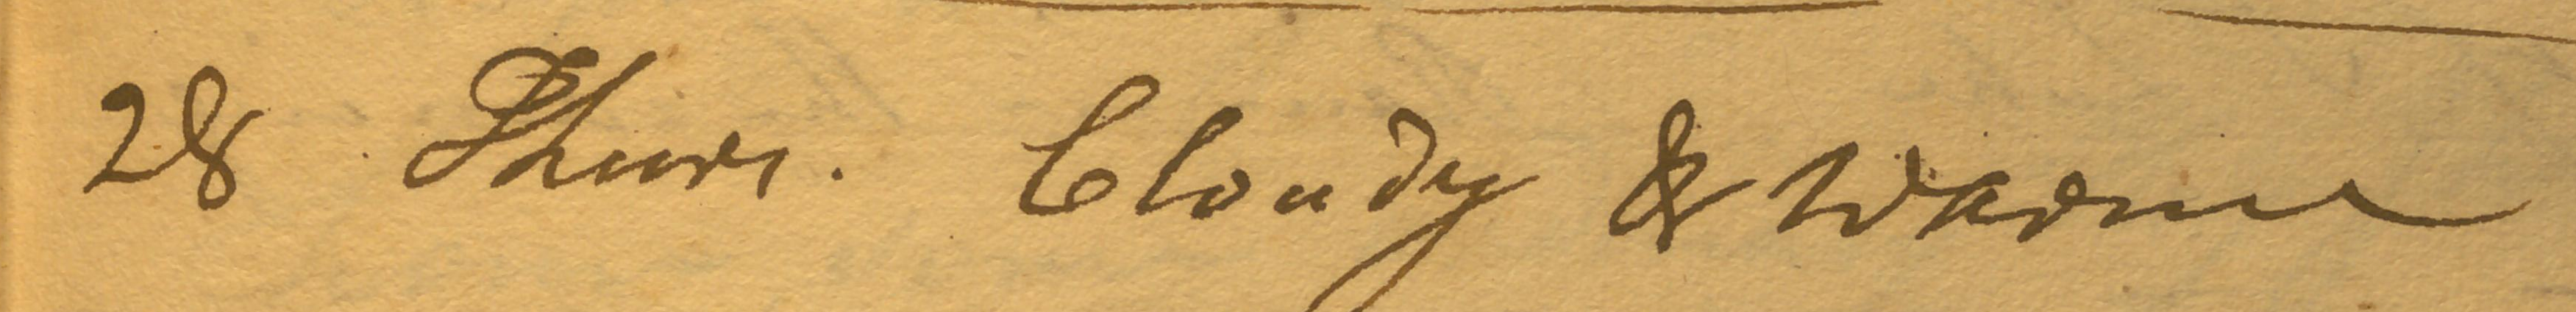28 Thurs. Cloudy & warme
